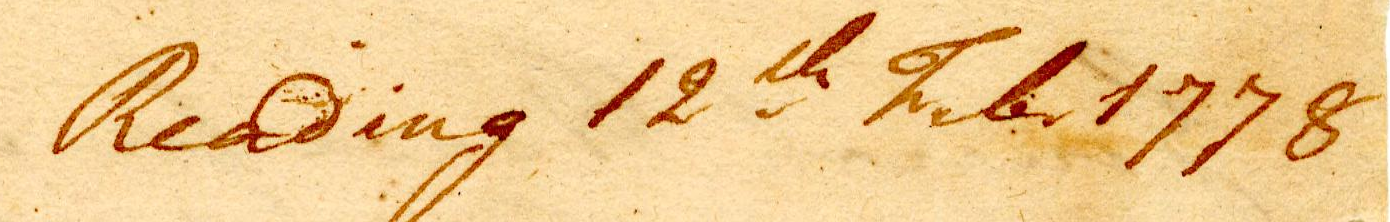Reading 12^th. Feb. 1778
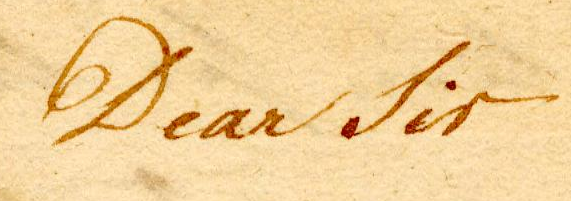Dear Sir
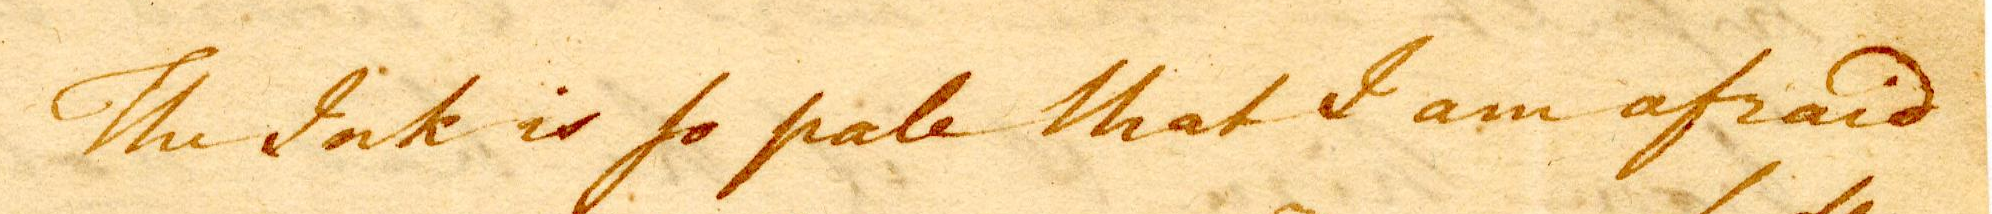The Ink is so pale that I am afraid
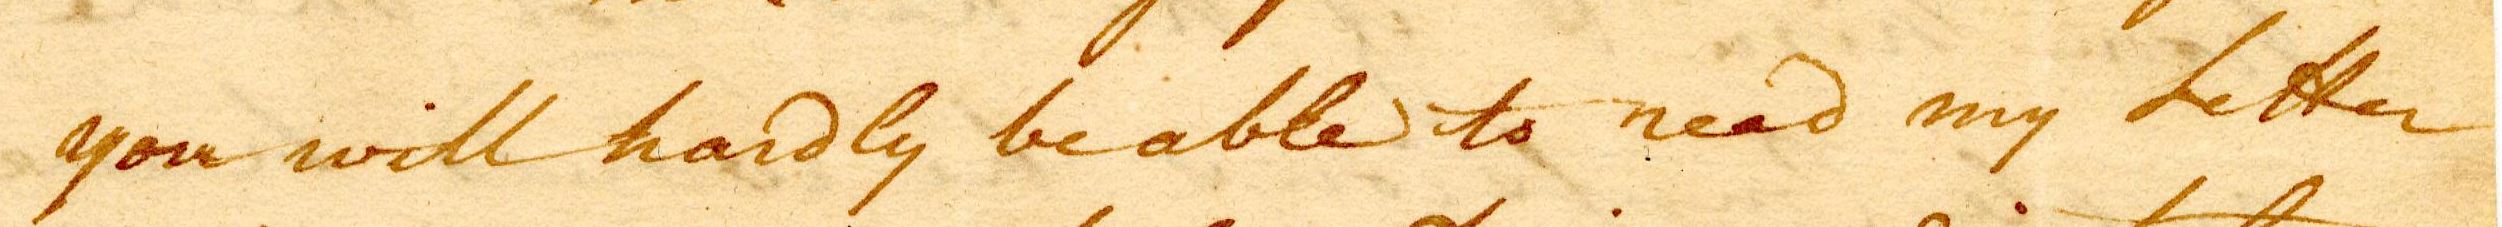you will hardly be able to read my Letter
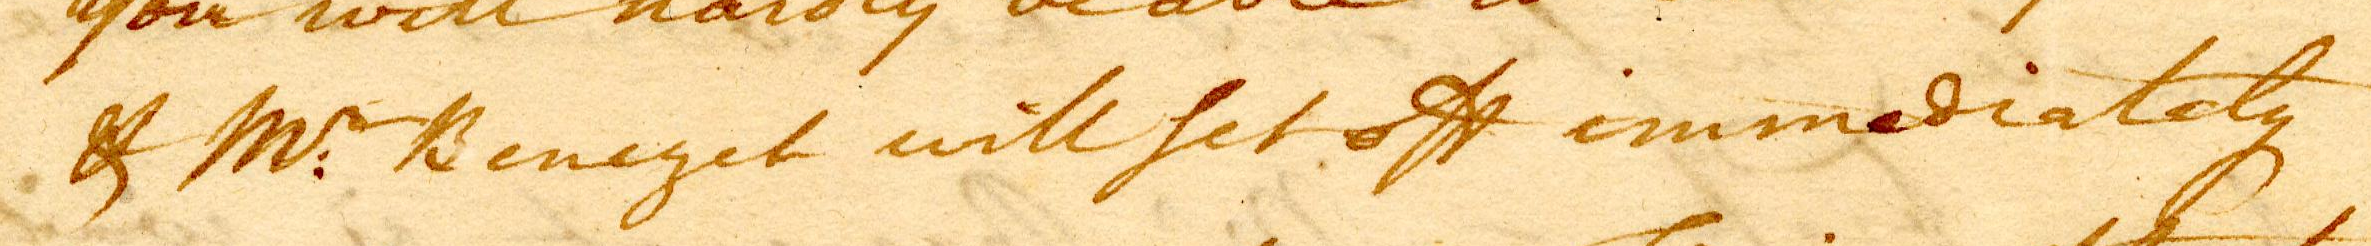& M^r: Benezet will set off immediately
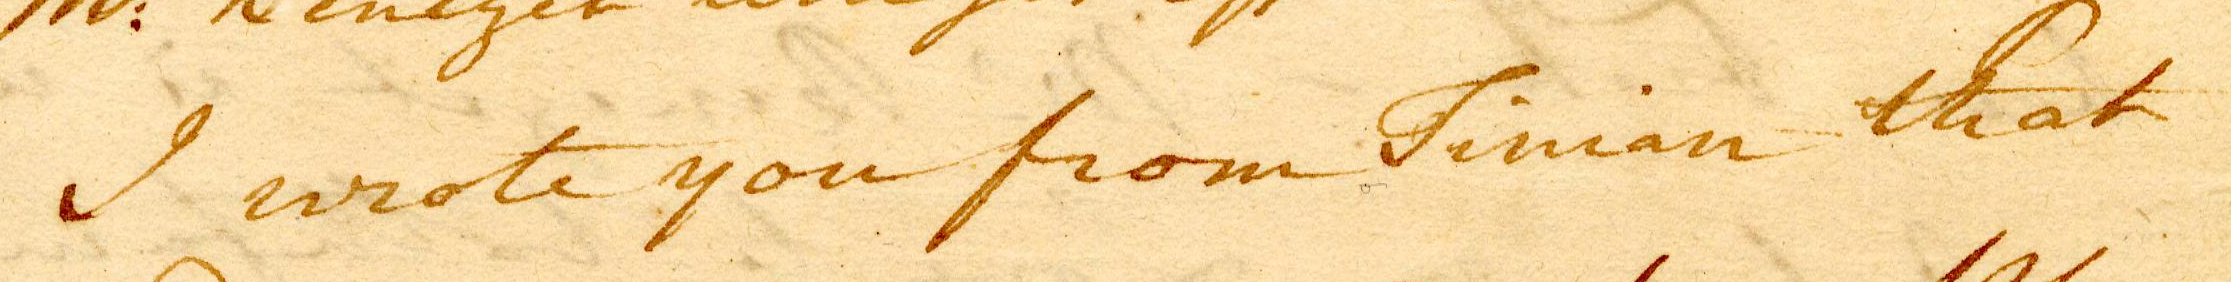I wrote you from Tinian that
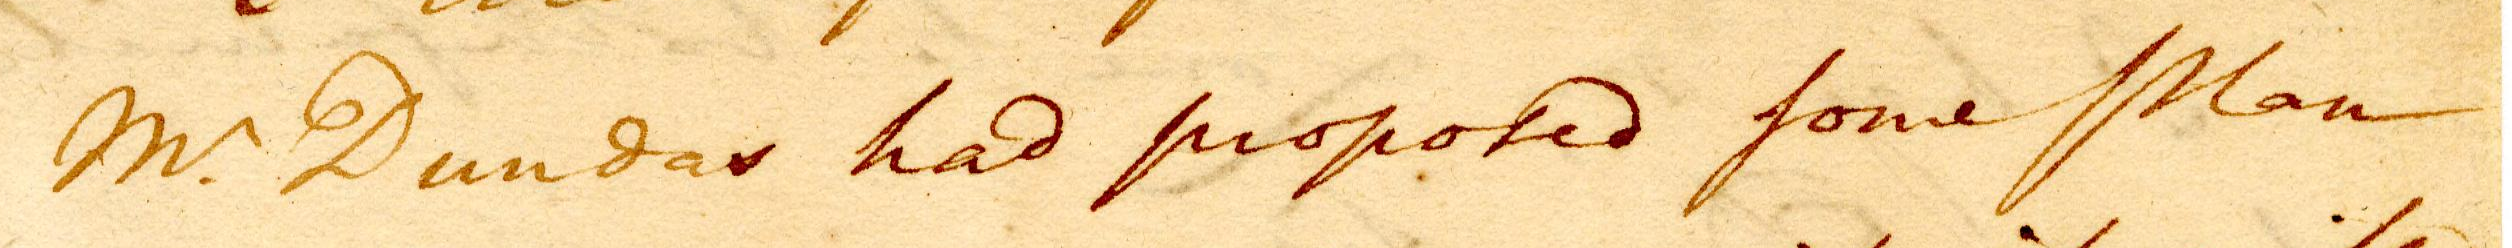M^r. Dundas had proposed some plan
